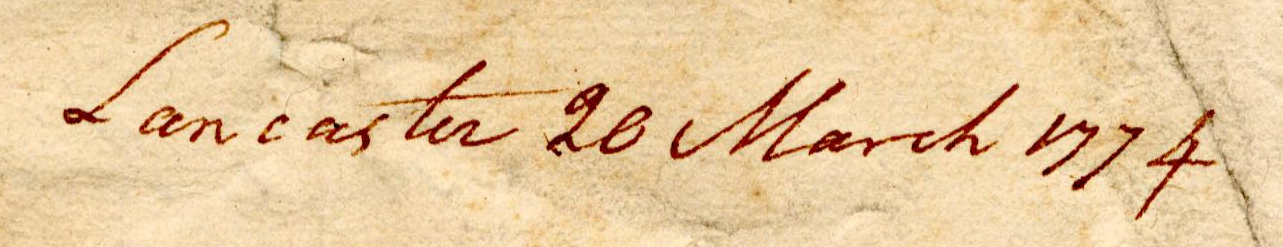Lancaster 20 March 1774
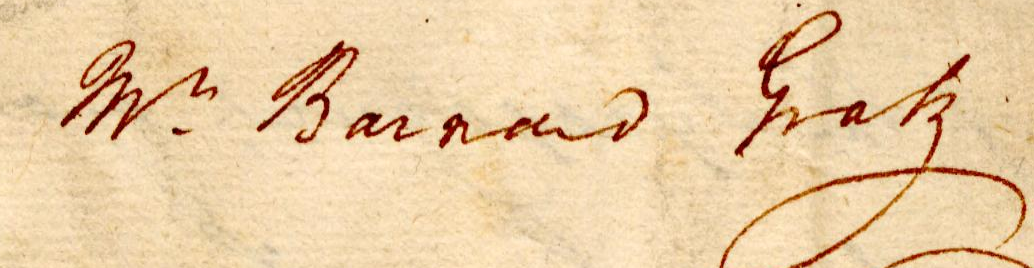M^r. Barnard Gratz
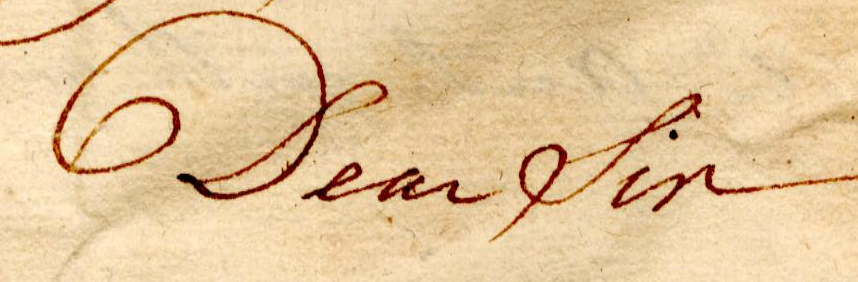Dear Sir
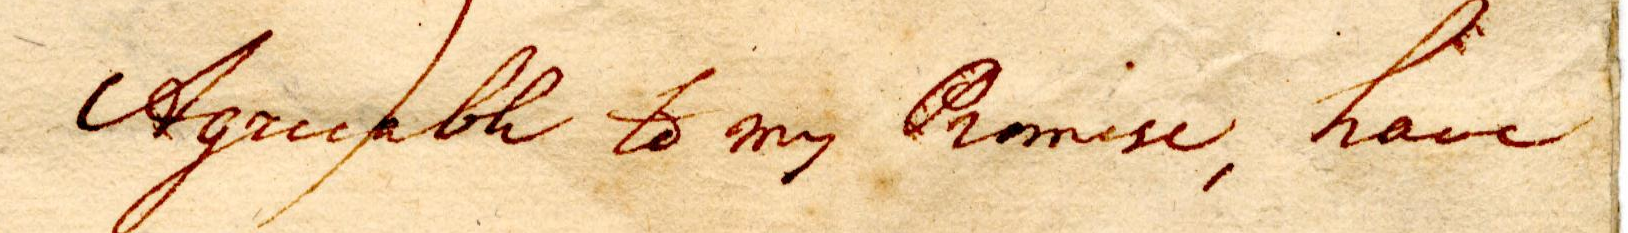Agreeable to my Promise, have
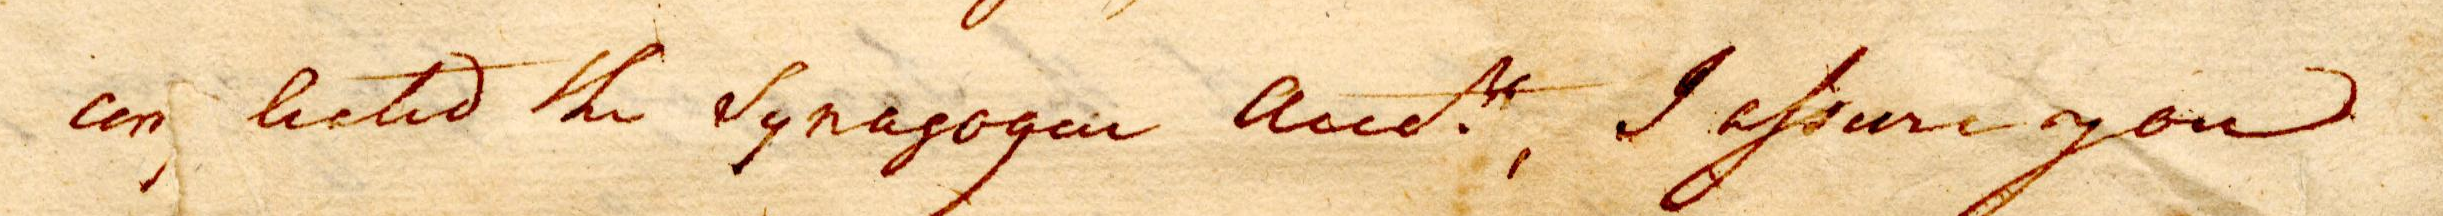con lected the Synagogue Acco^ts., I assure you
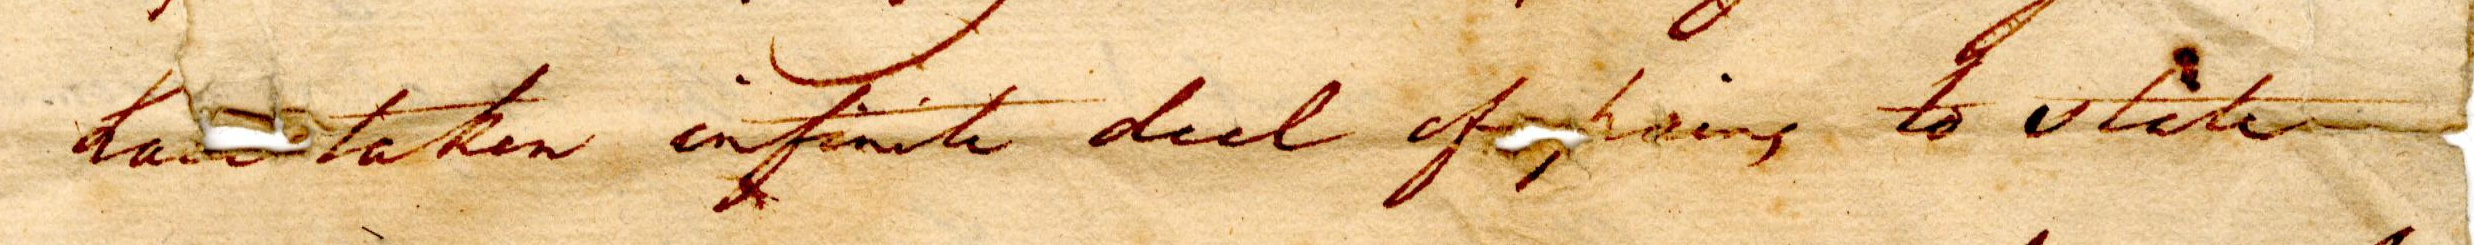[___] taken infinte deel ef[____]ing to stile
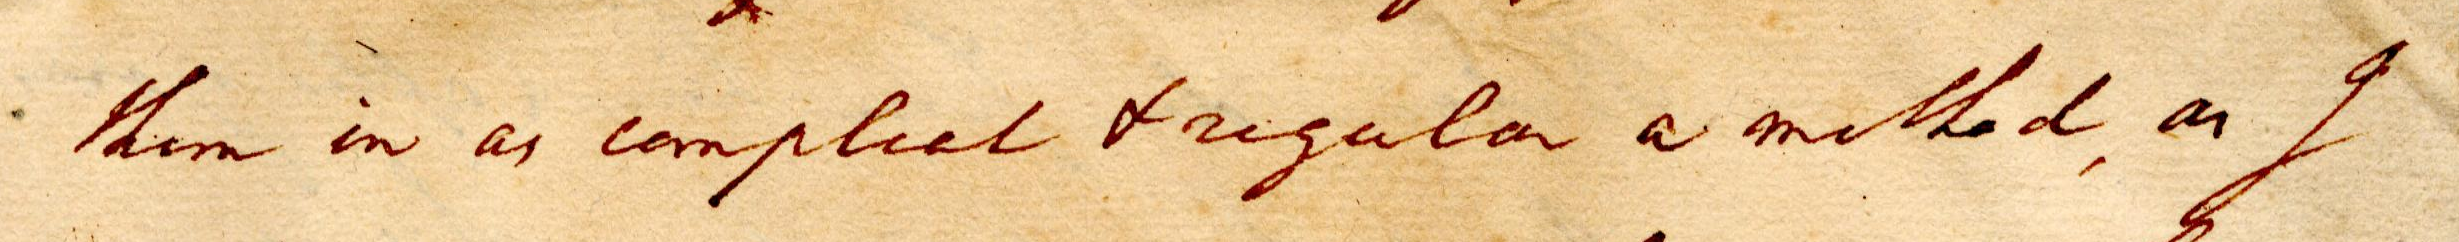them in as compleat & regular a method as I
